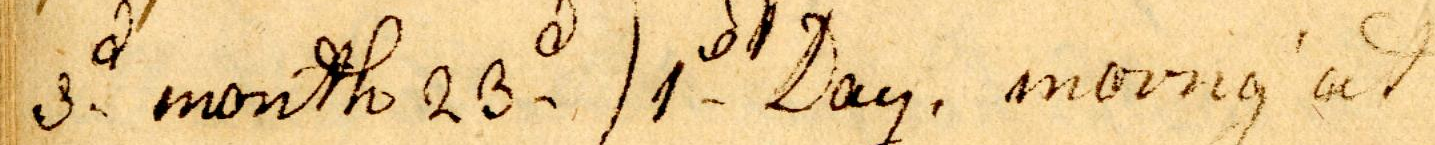3^d. month 23^d. ) 1^st Day. morng at
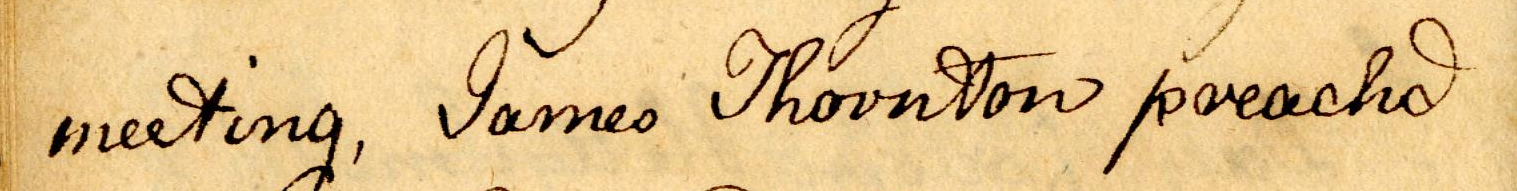meeting, James Thornton preachd
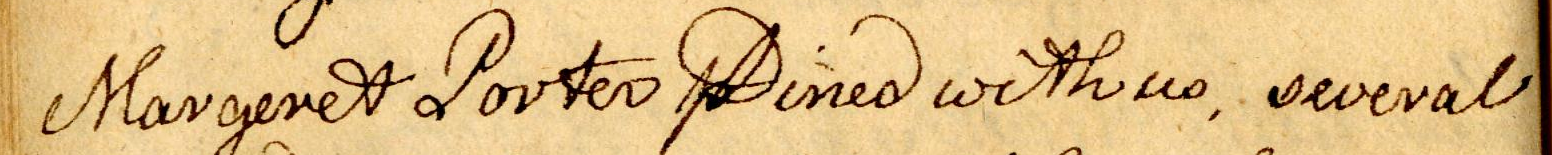Margeret Porter Dined with us, several
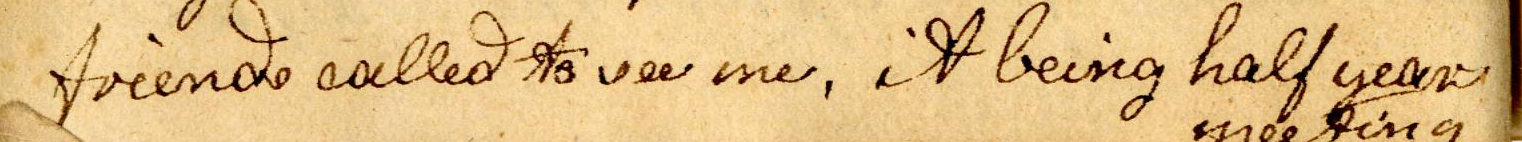friends called to see me, it being half years
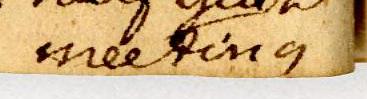meeting
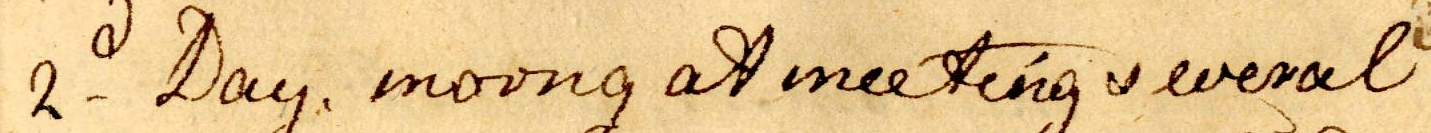2^d Day. morng at meeting several
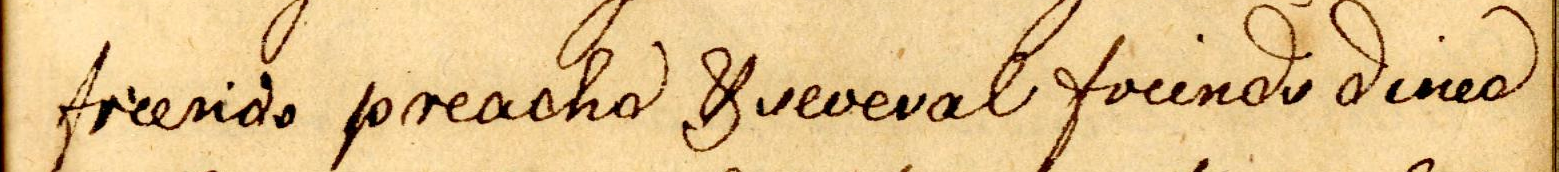friends preachd & several friends dined
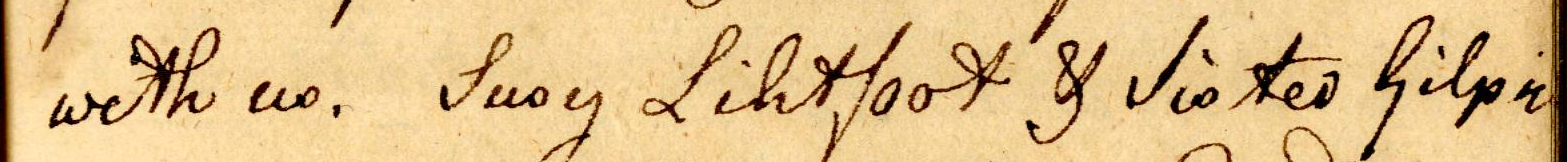with us. Susy Lightfoot & Sister Gilpin
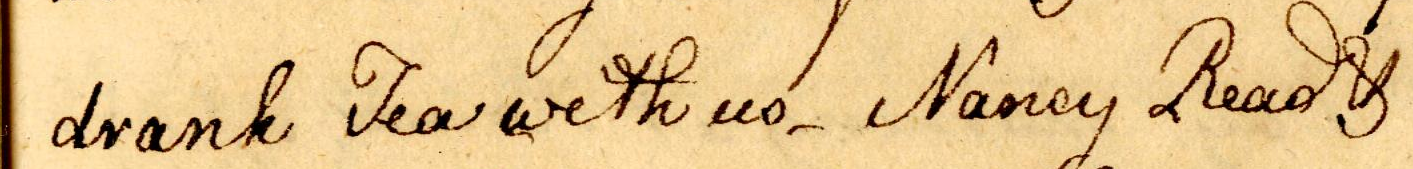drank Tea with us- Nancy Read &
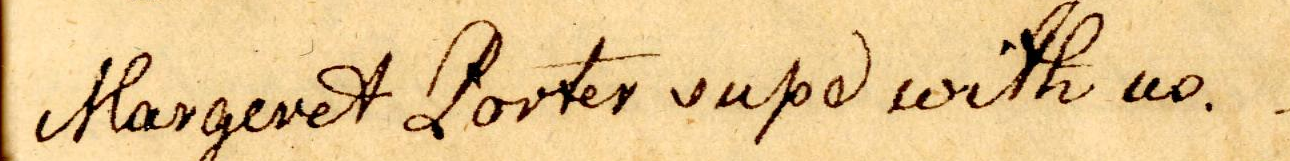Margeret Porter supd with us.-
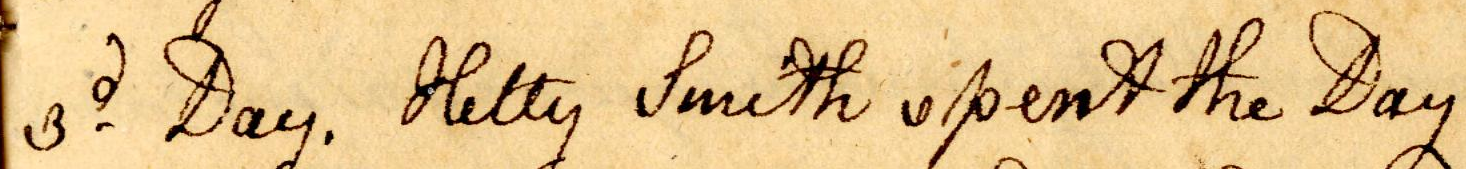3^d. Day. Hetty Smith spent the Day
